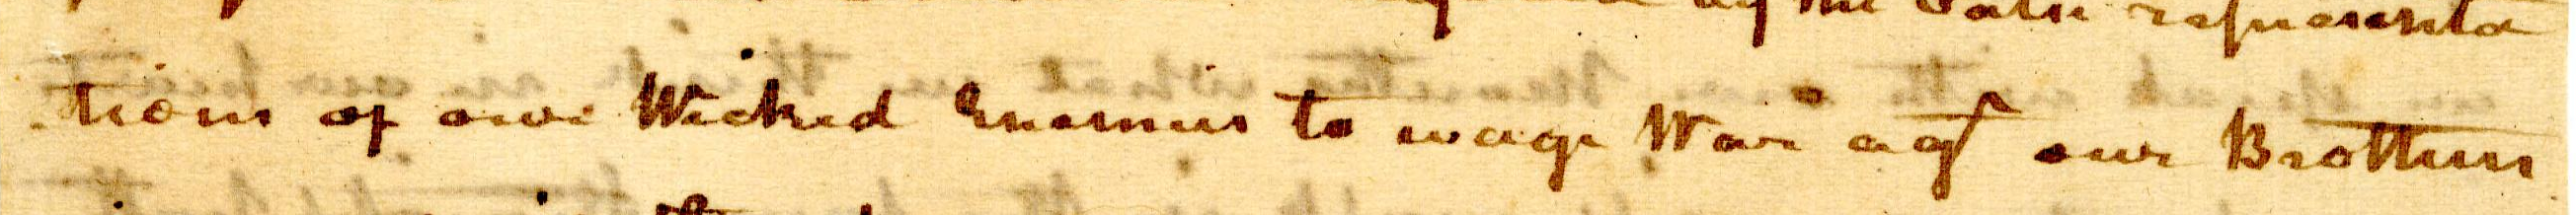-tions of our Wicked Enemies to wage War ag^t our Brothers
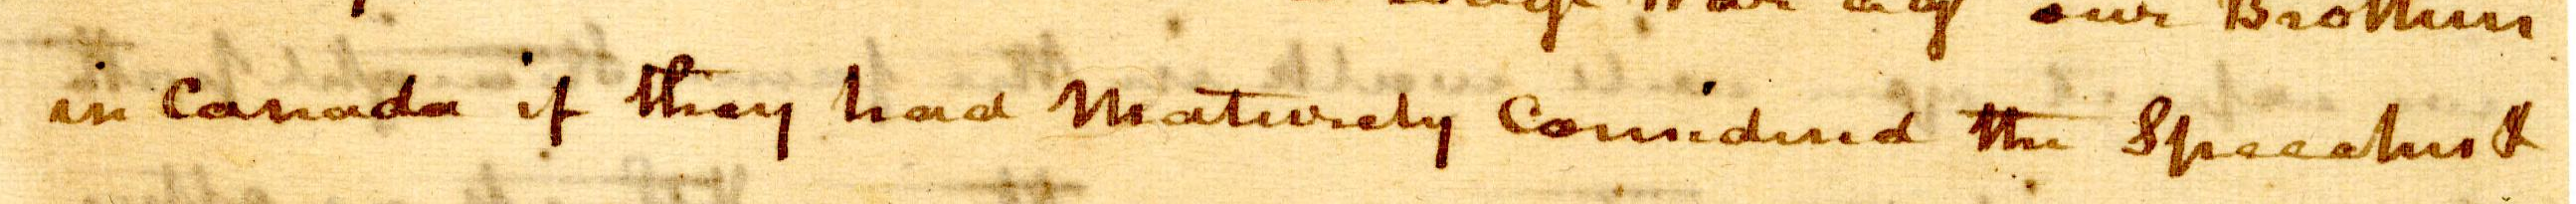in Canada if they had maturely considered the Speeches &
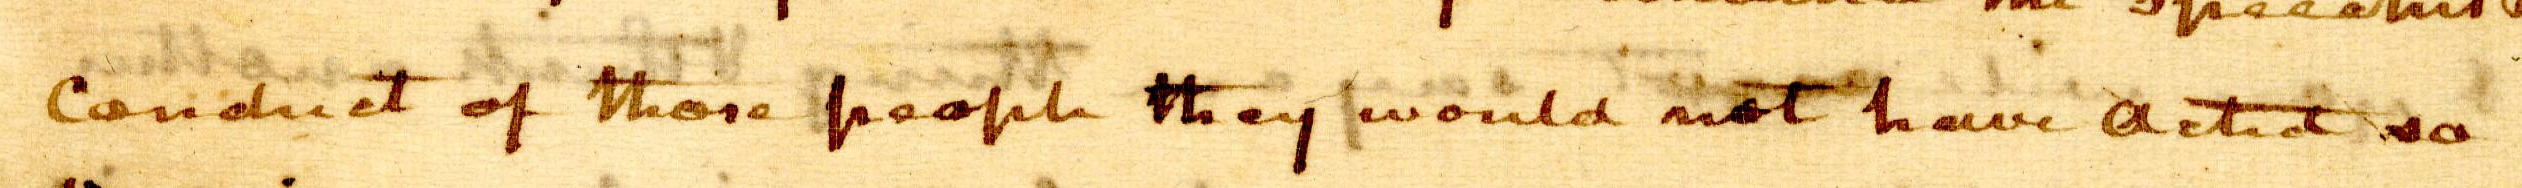Conduct of those people they would not have Acted so
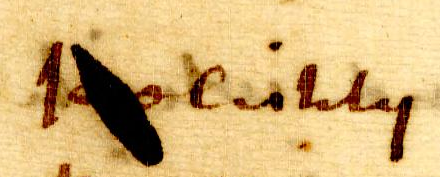foolishly
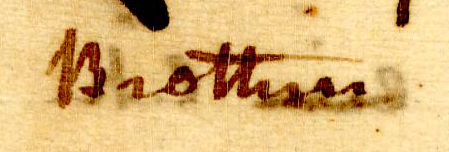Brothers
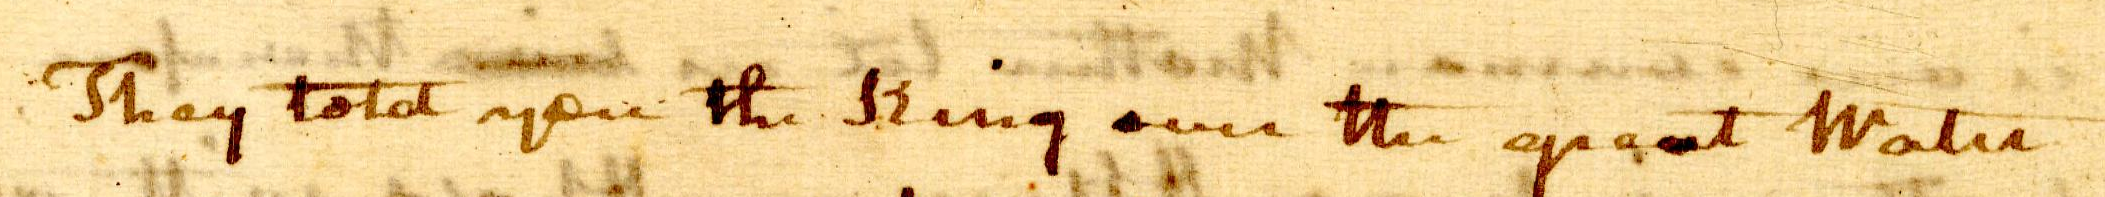They told you the King over thee great Water
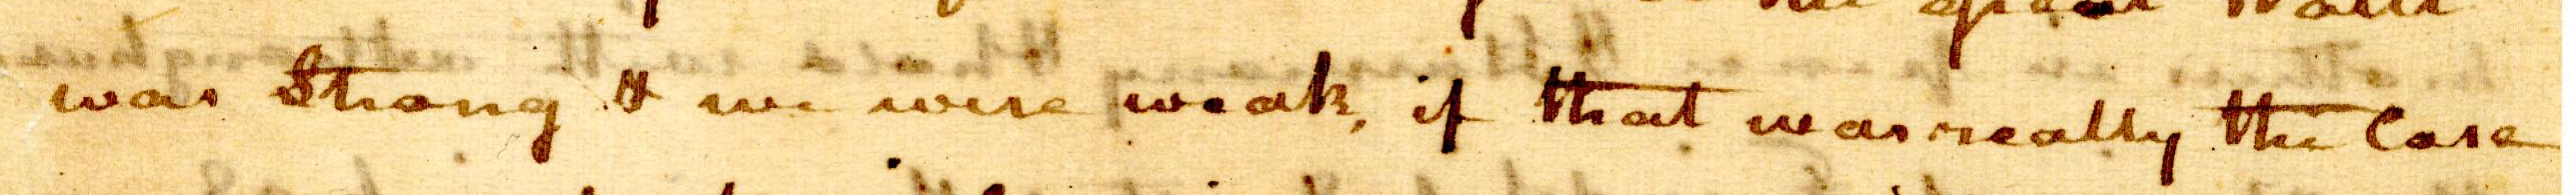was strong & we were weak, if that was really the Case
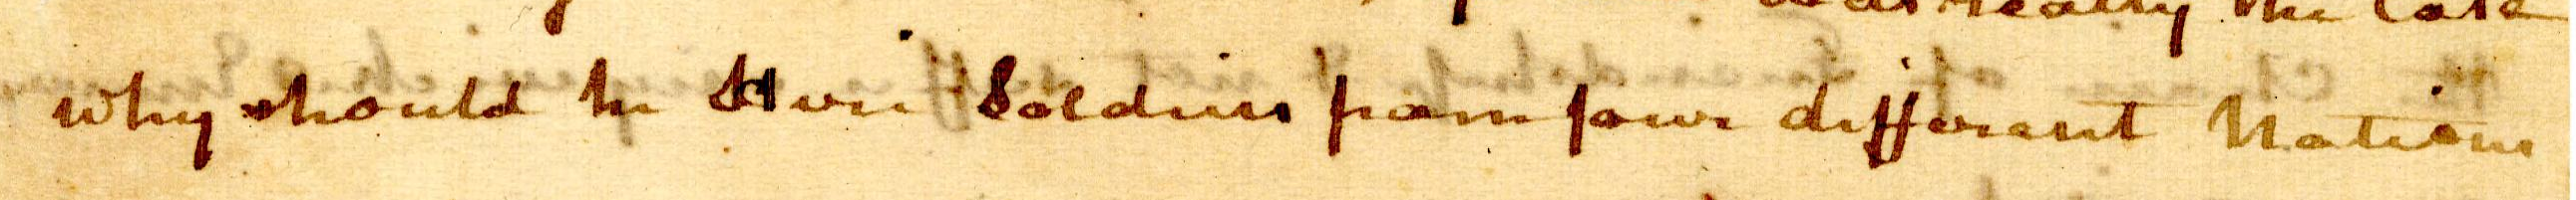why should he Hire Soldiers from four different Nations
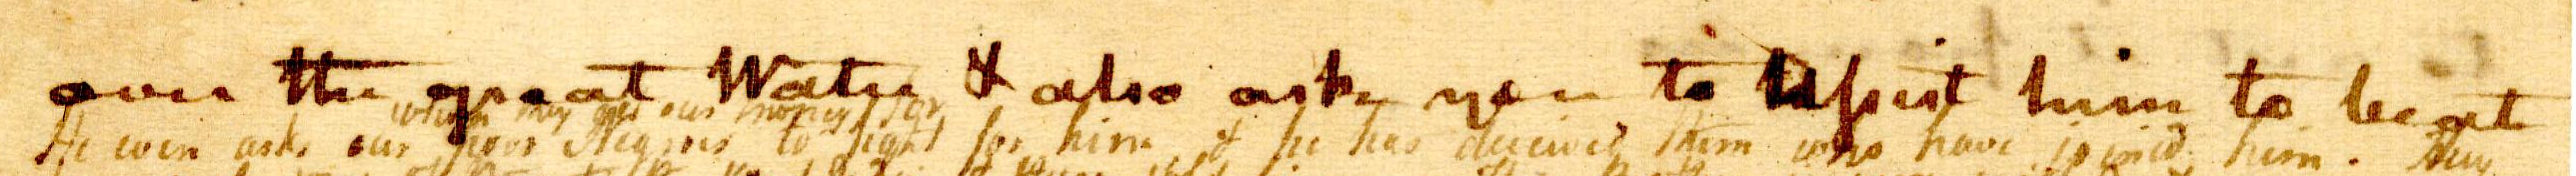over the great Water & also ask you to assist him to beat
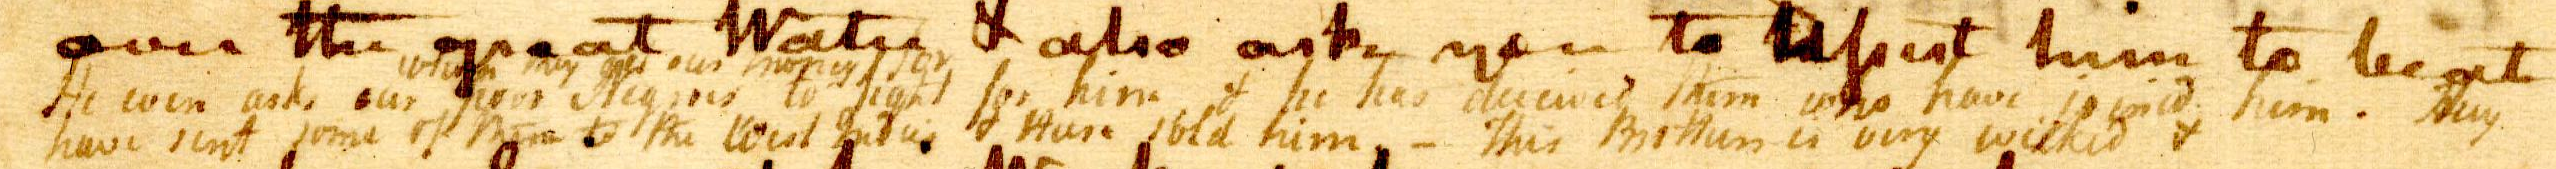He even asks our ^ poor Negroes to fight for him & he has deceived them who have joined him. They
